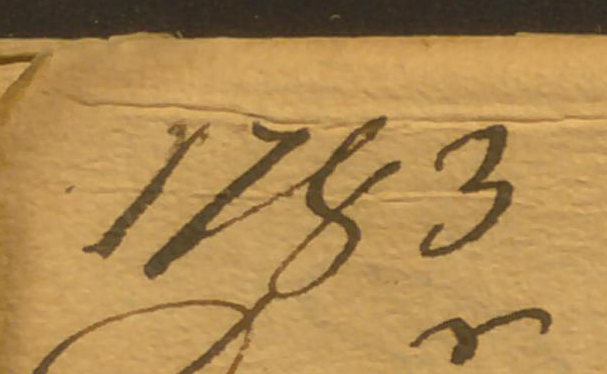1783
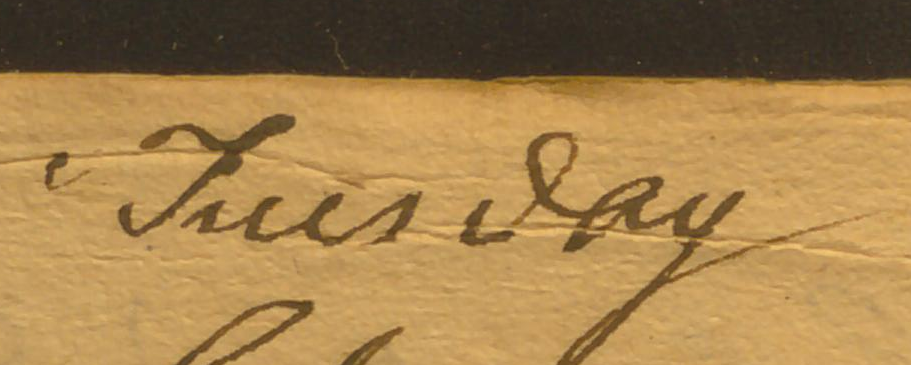Tuesday
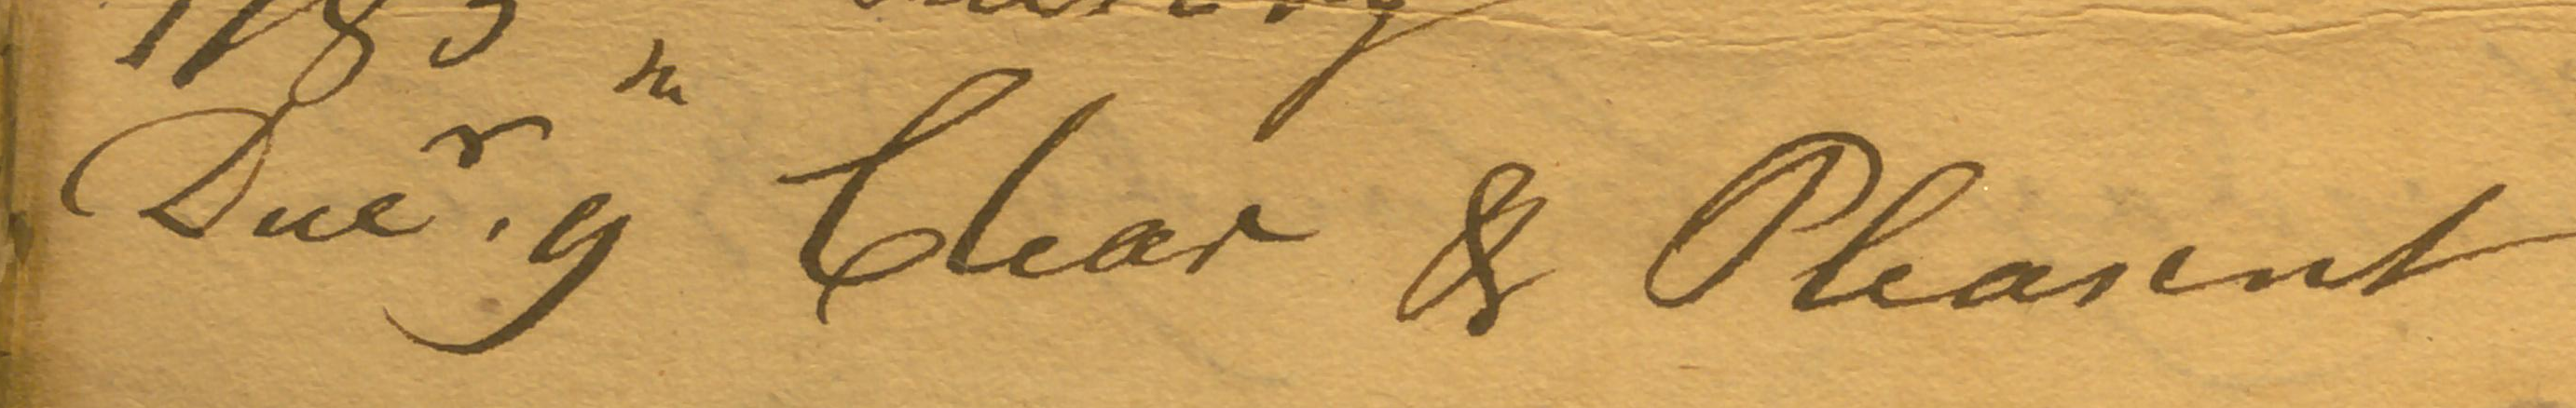Dece^r. 9^th Clear & Pleasent
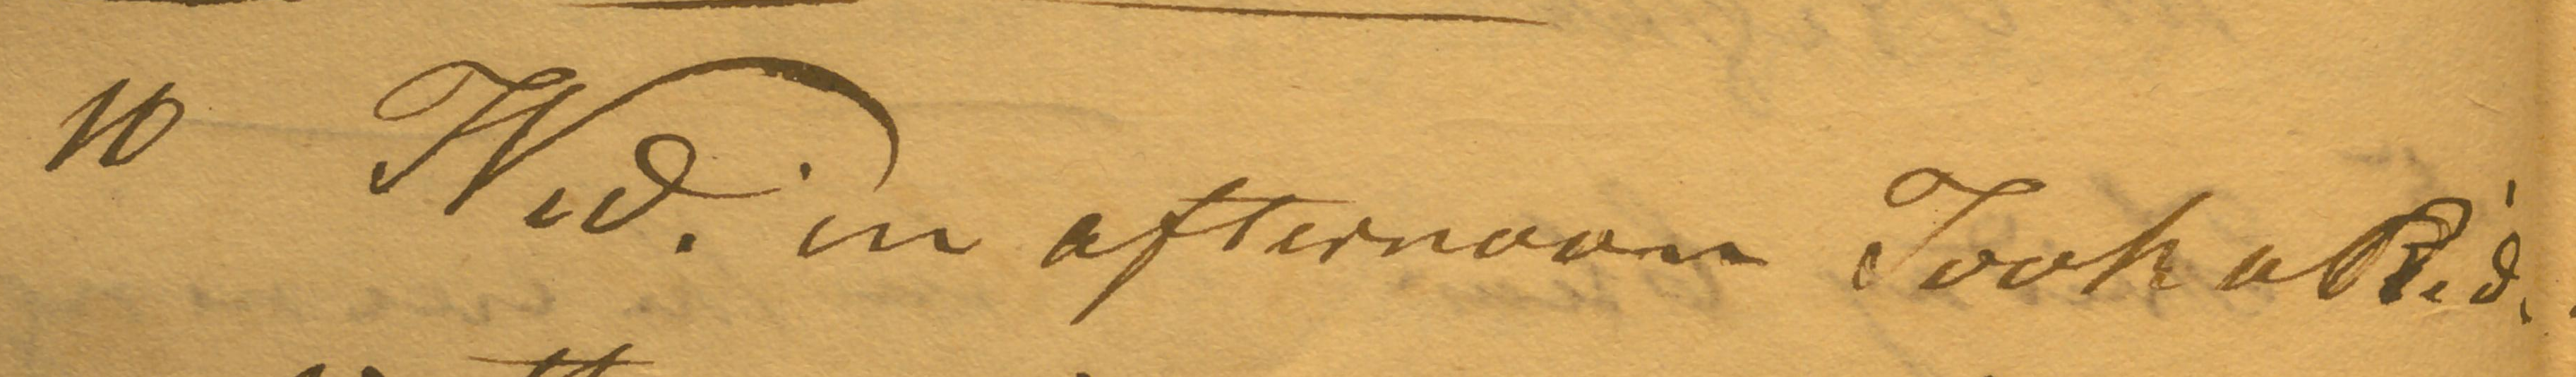10 Wed. in afternoon Took a Ride
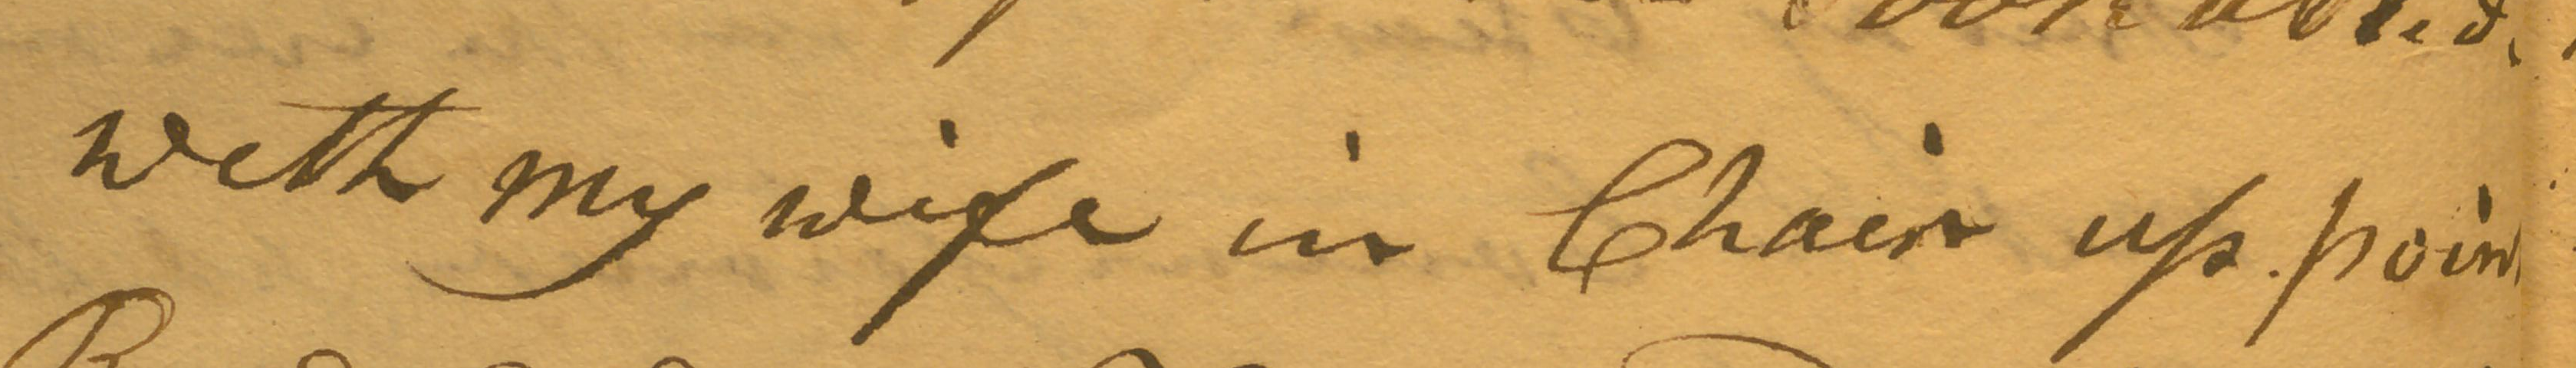with my wife in Chair up point
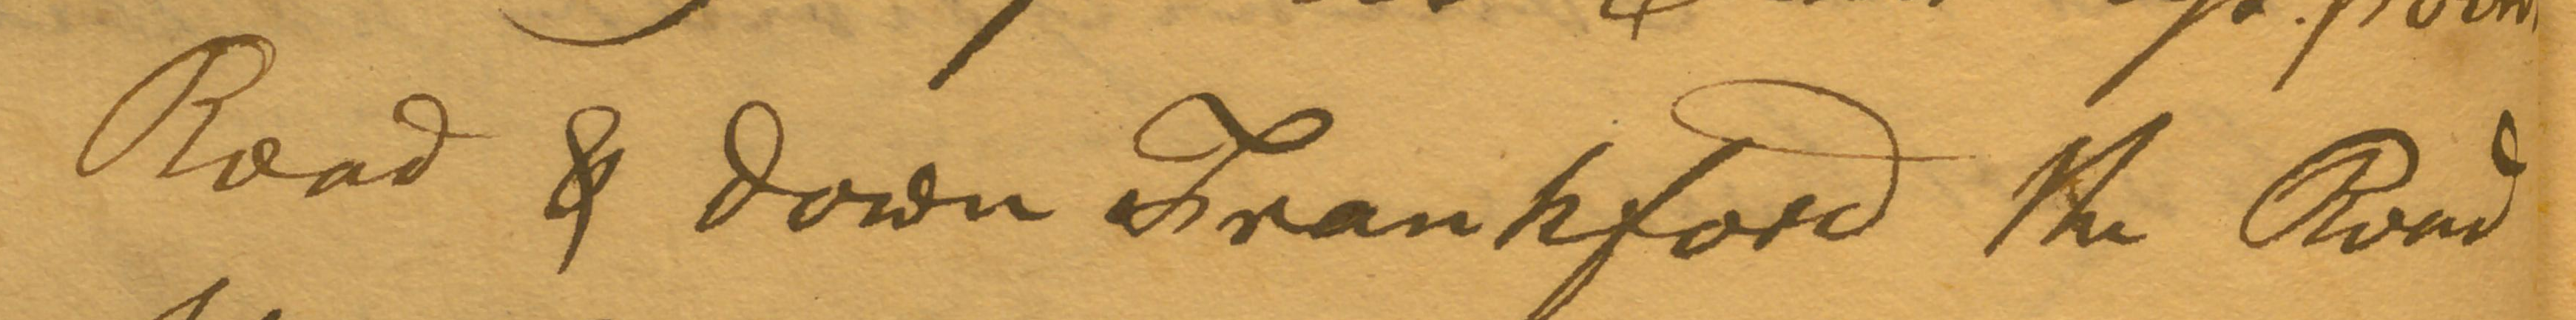Road & down Frankford the Road
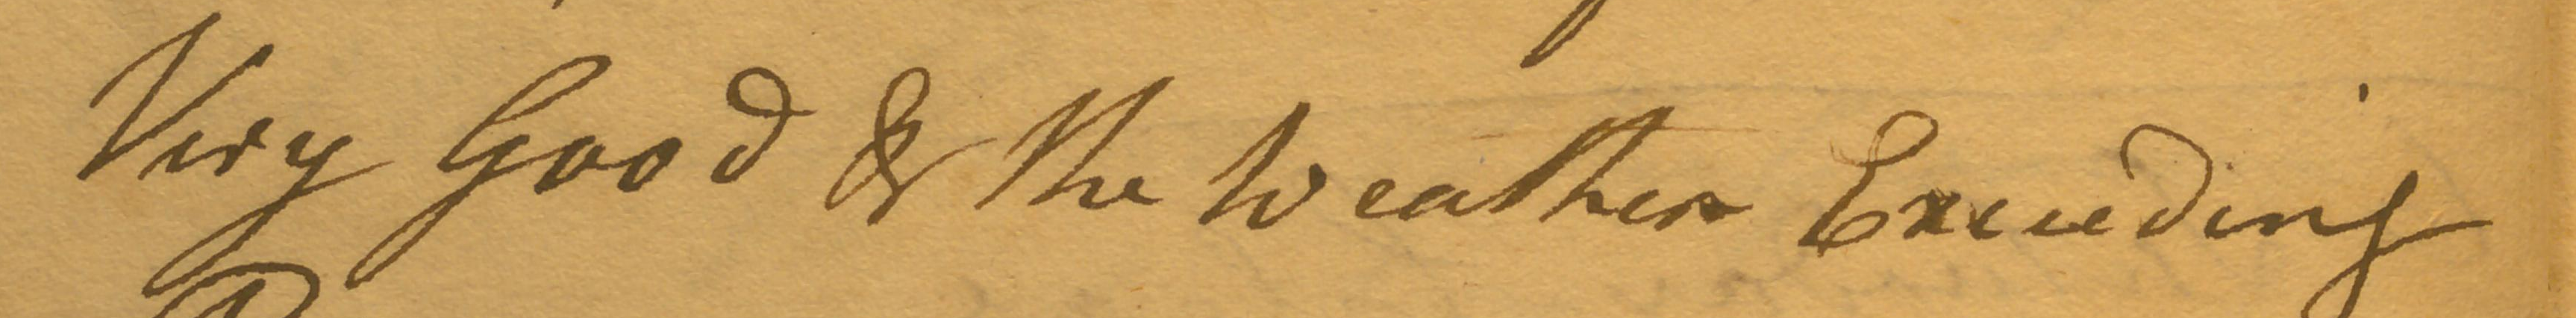Very Good & the Weather Exceeding
